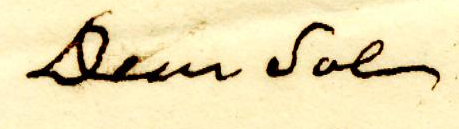Dear Sol
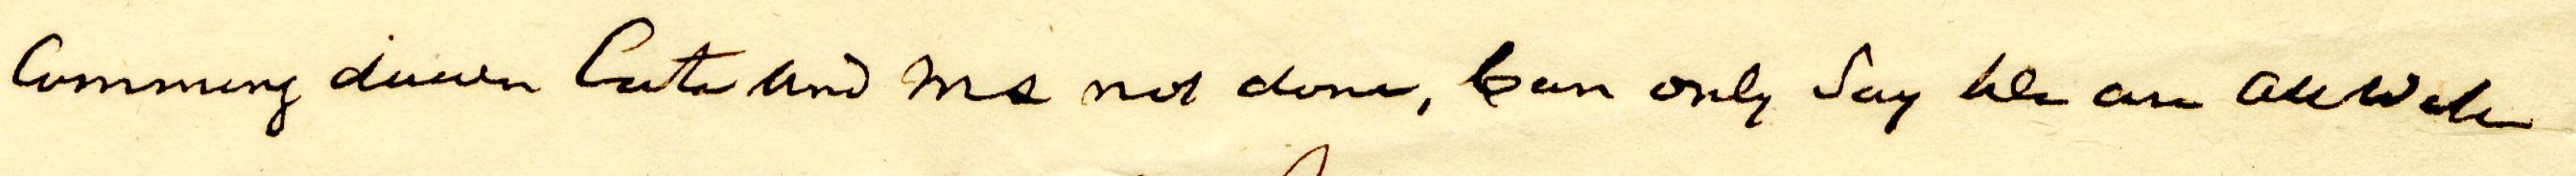Comming down late and me not done, can only say we are all well
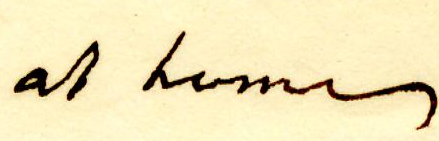at home
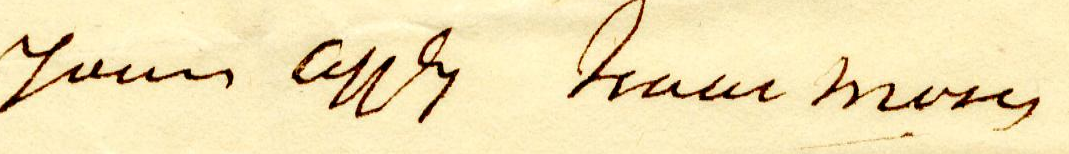yours aff^y Isaac Moses
